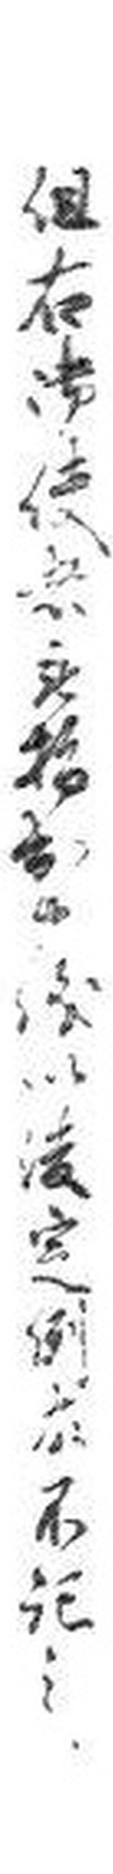但右御使者被指出候儀以後定例故不記之
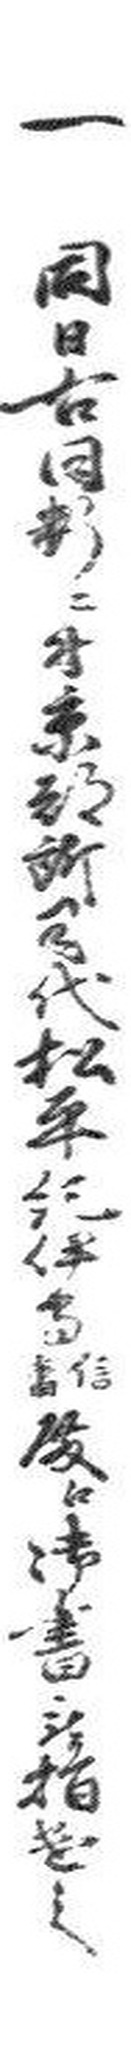一同日右同断ニ付京都所司代松平紀伊之守信庸殿江御書被指遣之
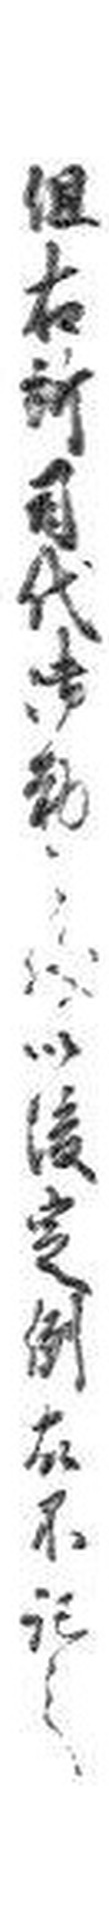但右所司代御勤之儀以後定例故不記之
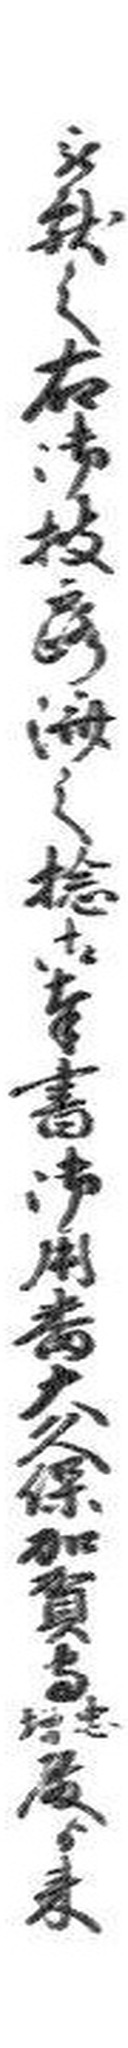被献之右御披露済之捻御奉書御用番大久保加賀守忠増殿ゟ来
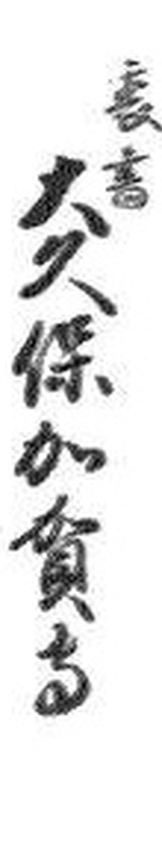大久保加賀守
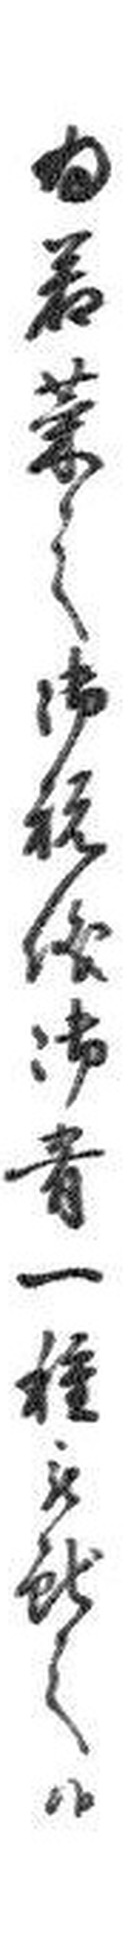為若菜之御祝儀御肴一種被献之候
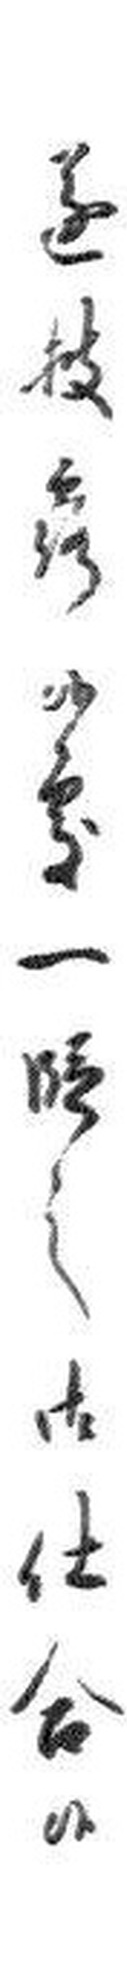遂披露候処一段之御仕合候
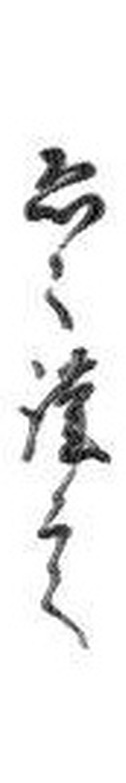恐々謹言

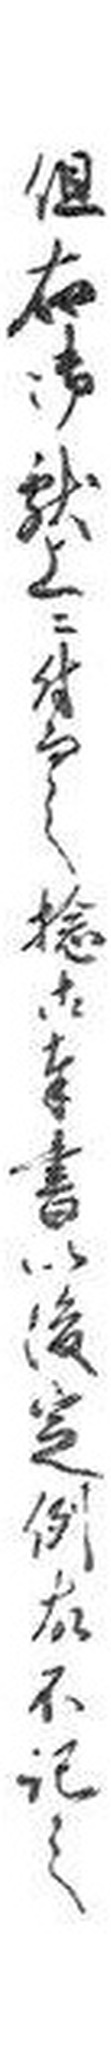但右御献上ニ付而之捻御奉書以後定例故不記之
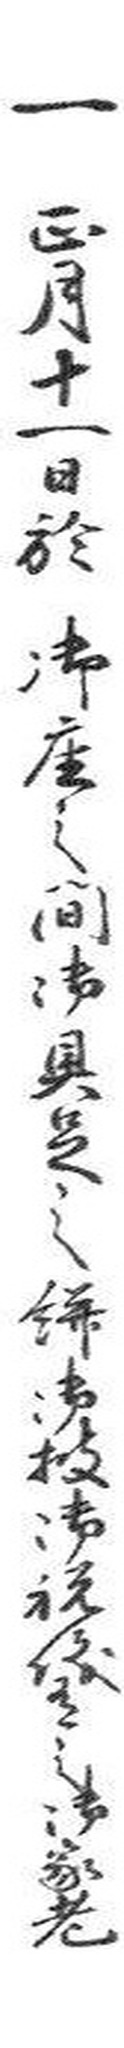一正月十一日於御座之間御具足之餅御披御祝儀有之御家老
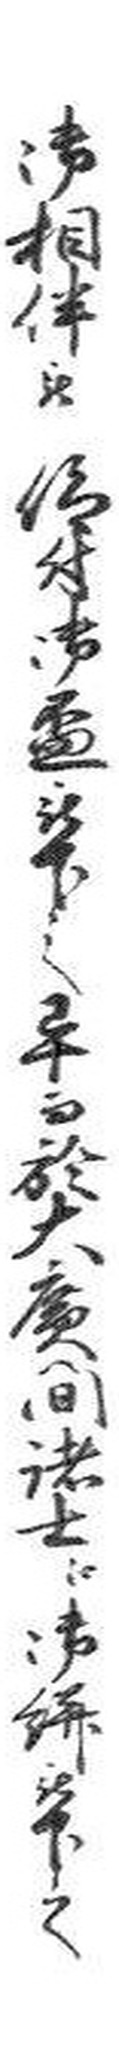御相伴被仰付御盃被下之畢而於大広間諸士江御餅被下之
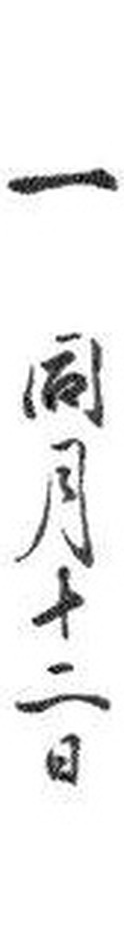一同月十二日
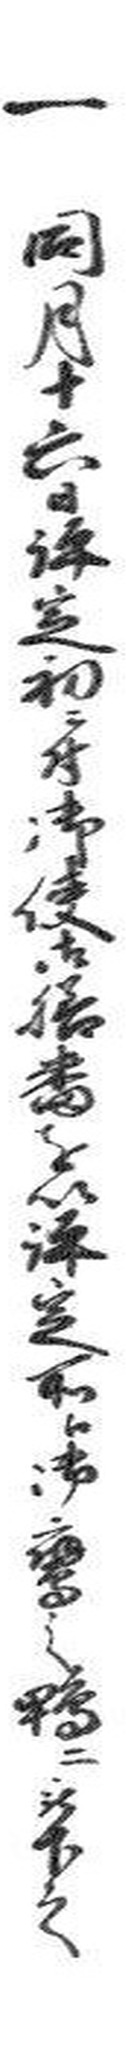一同月十六日評定初ニ付御使御膳番を以評定所江御鷹之鴨二被下之
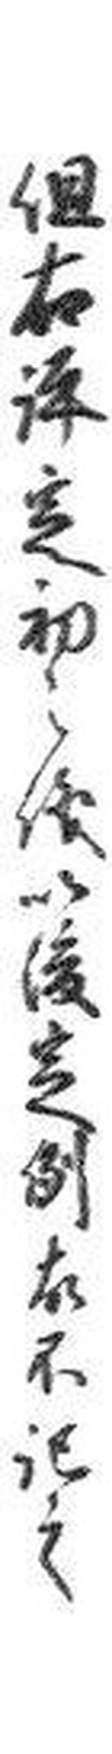但右評定初之儀以後定例故不記之
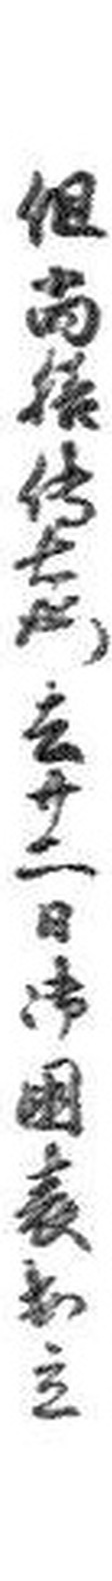但尚膳伝右衛門去廿二日御国表出立
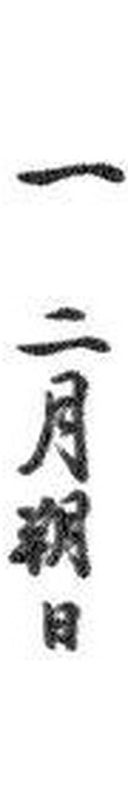一二月朔日
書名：家譜 二十八 吉邦公 従宝永七年七月五日到正徳元年十二月
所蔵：福井県文書館 Fukui Prefectural Archives
